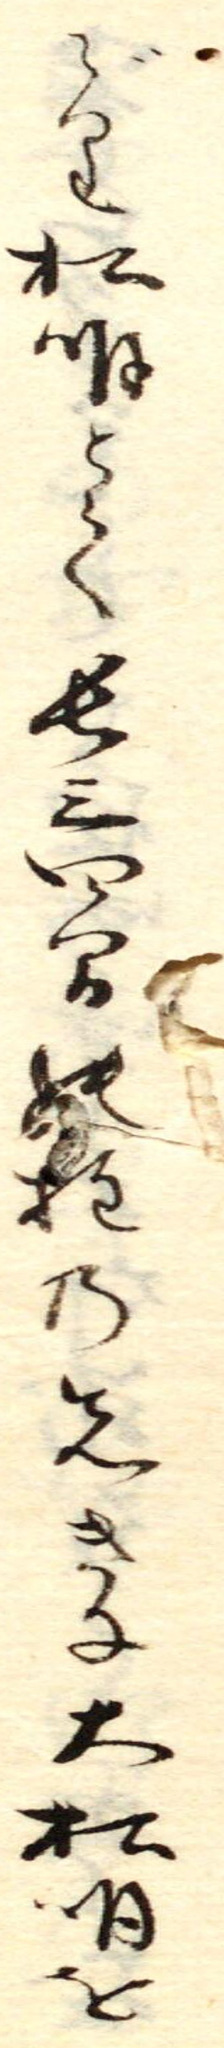ゞり松明とて長三四間の抱の先に大松明を
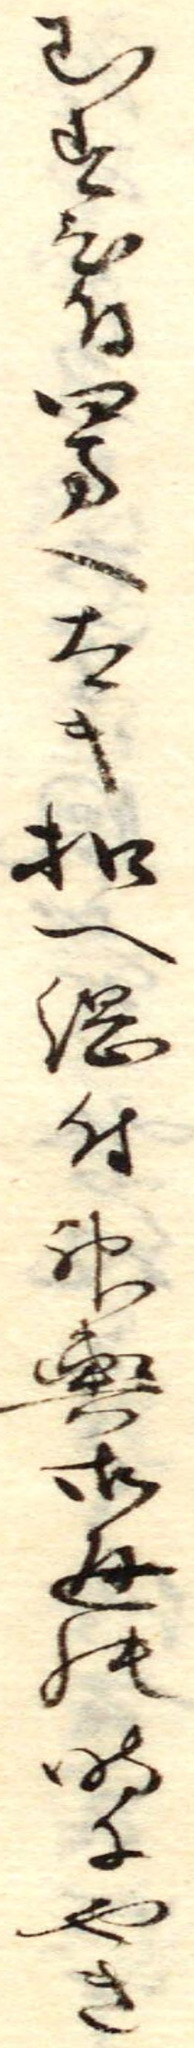出す心付四方へ太き扣へ綱付神輿御通の時にやき
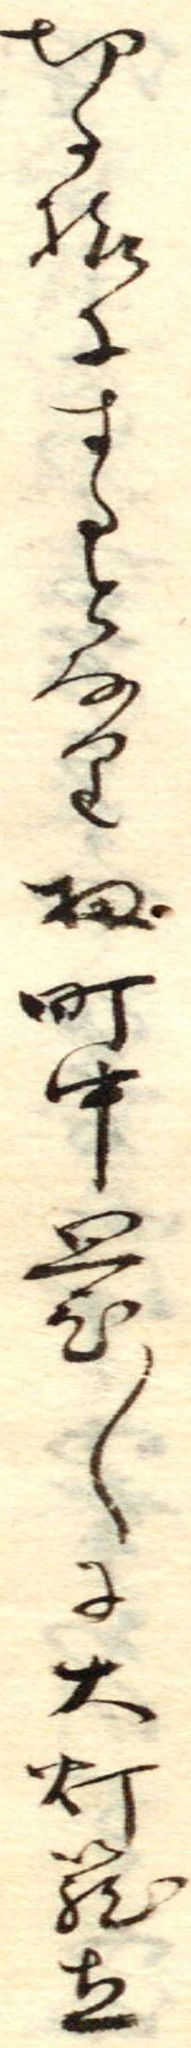切る様にするとなり扨町中ひ〳〵に大灯籠立
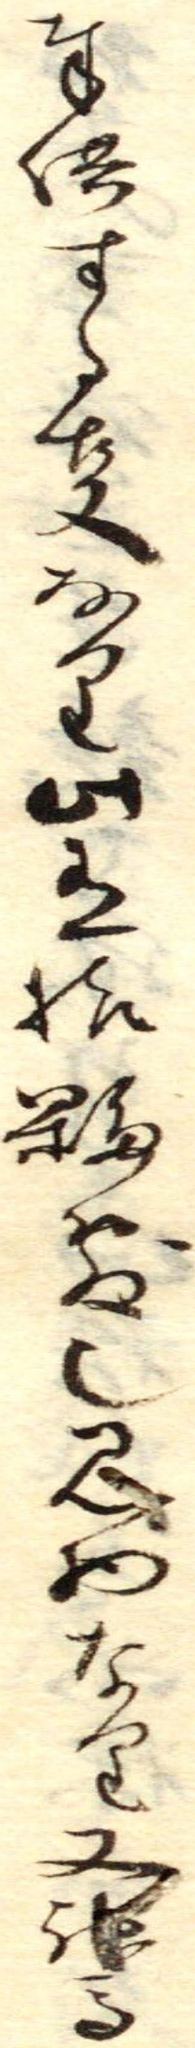奉供する事なり此有様夥敷也見物なり又神馬

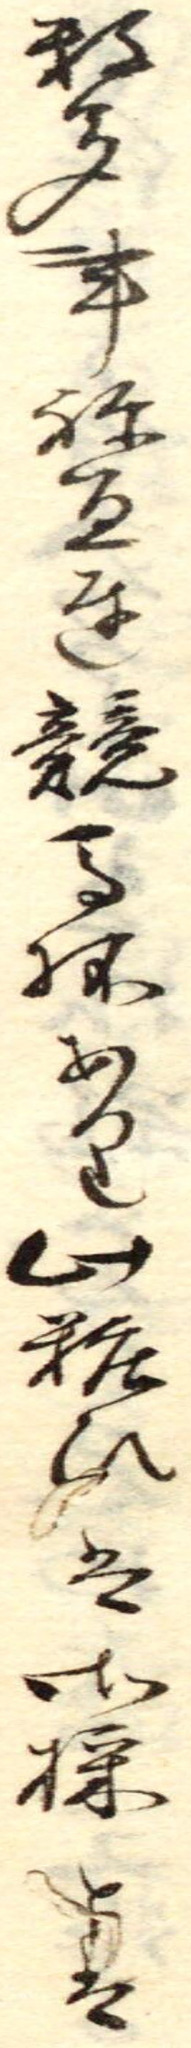数多事祢宜達競馬抔あり此粧ひは御採とは
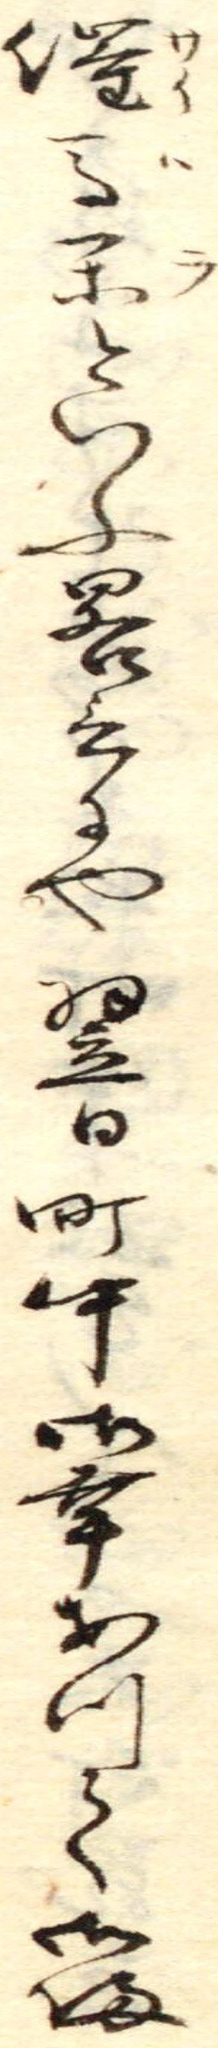催馬楽といふ略言にや翌日町中御幸あつて御帰
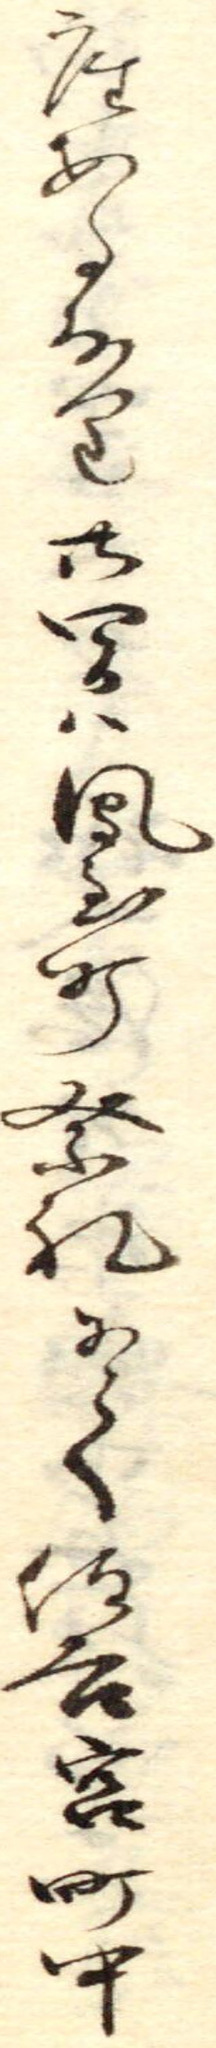座あるなり廿四日は鳳至町祭礼にて住吉宮町中
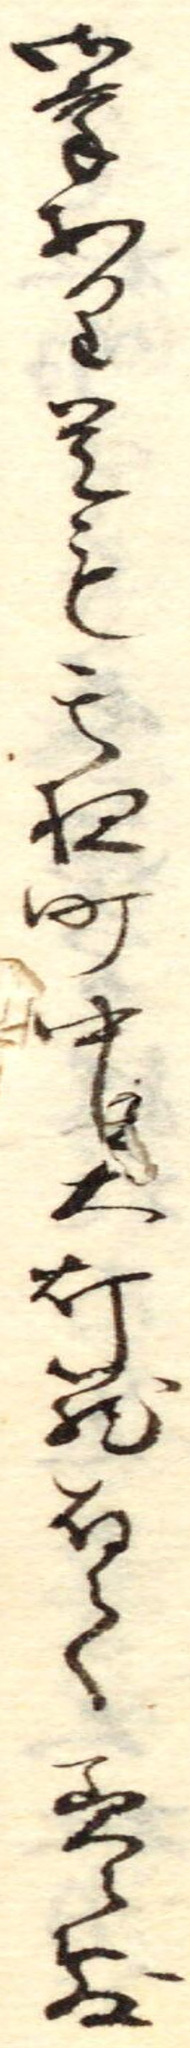御幸あり是も其夜ま町中大灯籠有て美々敷
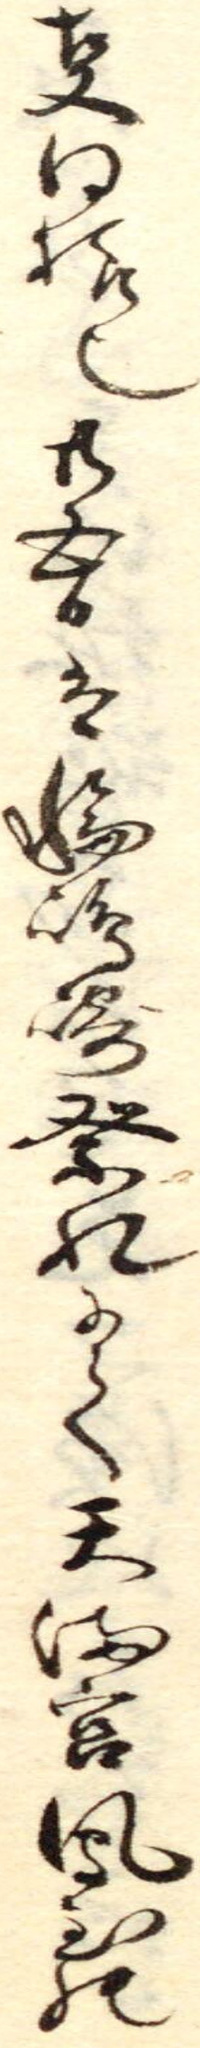事同様也廿五日は輪嶋崎祭礼にて天満宮鳳至の
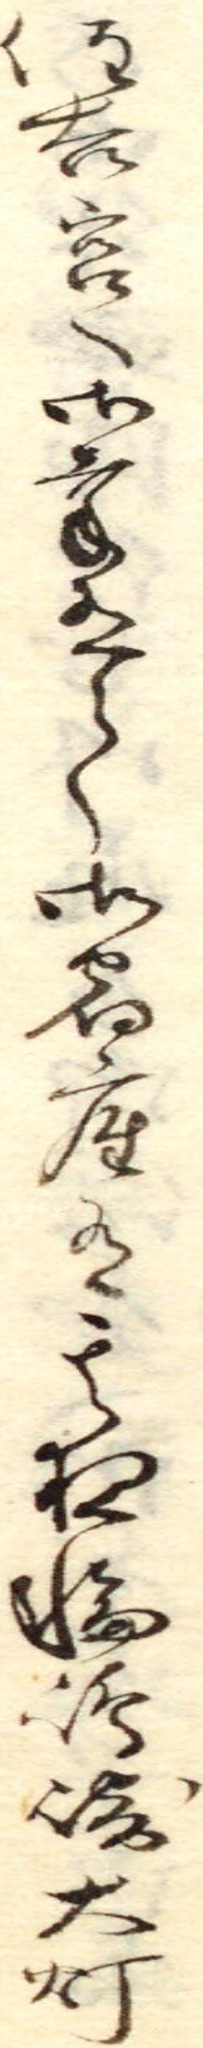住吉宮へ御幸有て御宿座有其夜輪嶋崎大灯
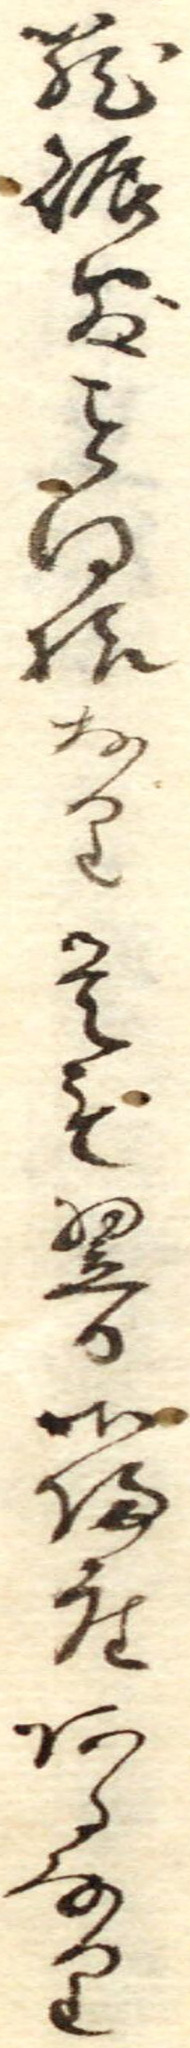籠賑敷こと同様なり是も翌日御帰座あるなり
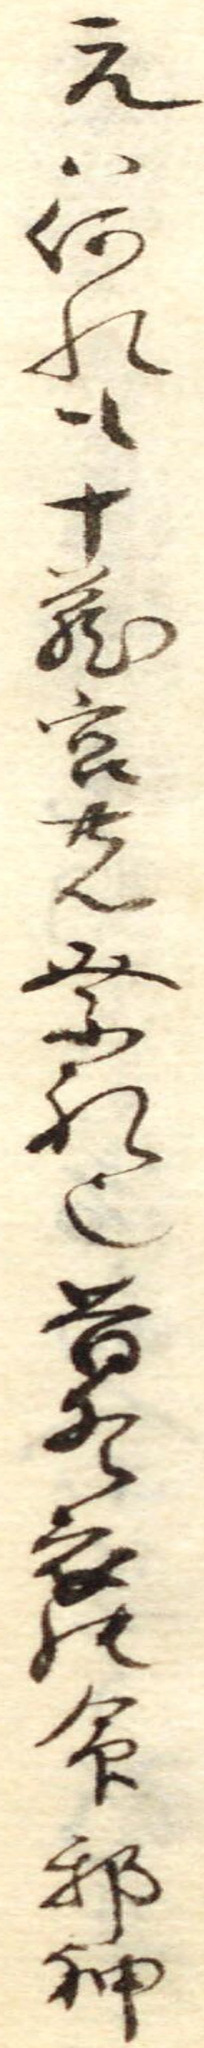元は何れも十蔵宮の祭礼也昔冬衣の命邪神
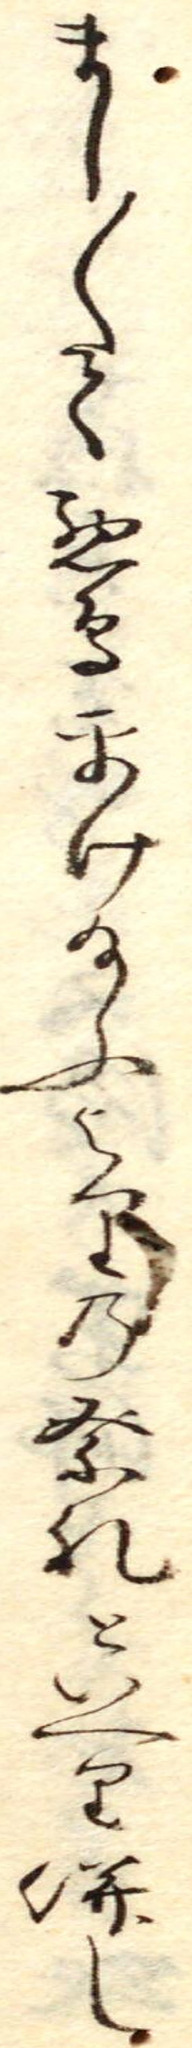まし〳〵て悪鳥平け給ふよりの祭礼といへり併し
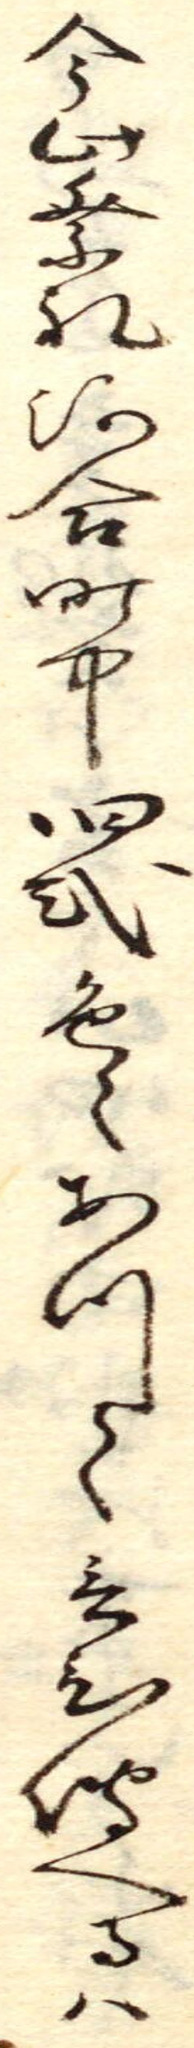今此祭礼河合町中旧式色々あつて言ひ伝へるは
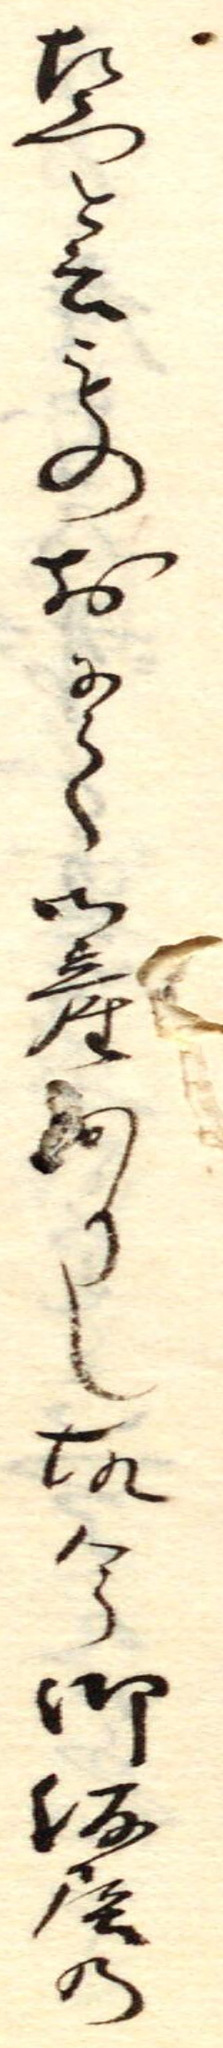左衛門と言もの前にて御産ありし故今御仮屋の
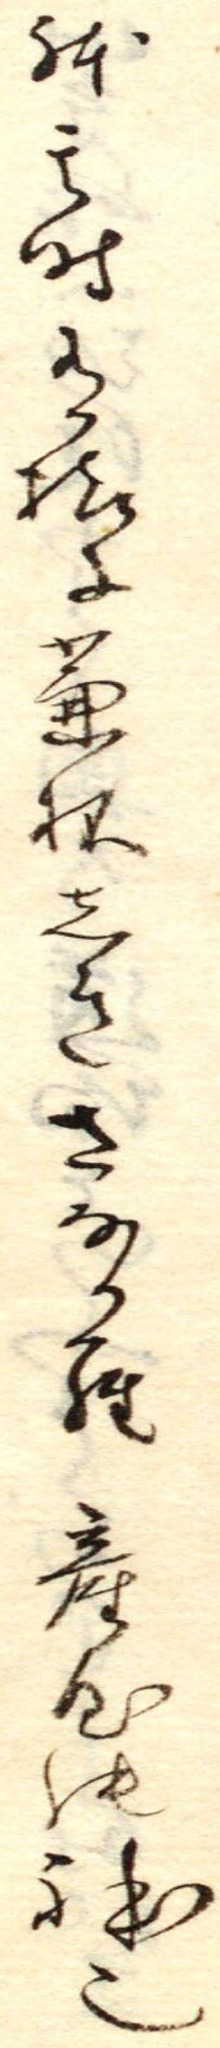躰其時有様に蒹抔しきさなから産屋の躰也
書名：能登名跡誌
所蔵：Ishikawa Prefectural Library
